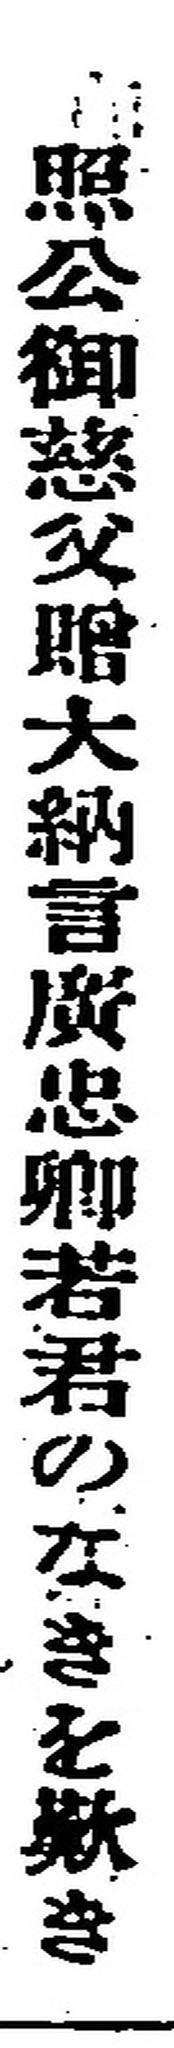照公御慈父贈大納言広忠卿若君のなきを歎き
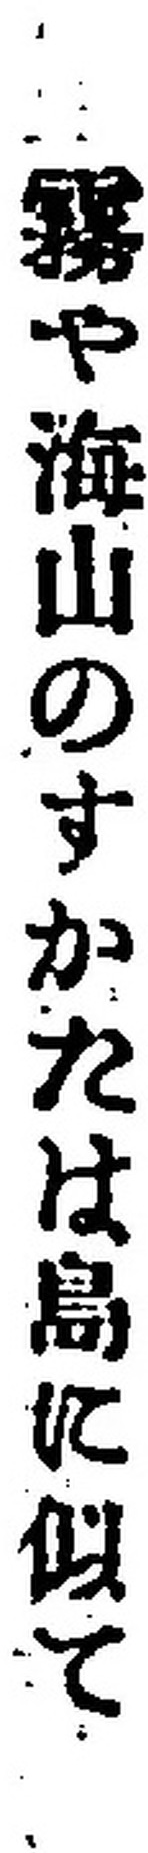霧や海山のすかたは島に似て
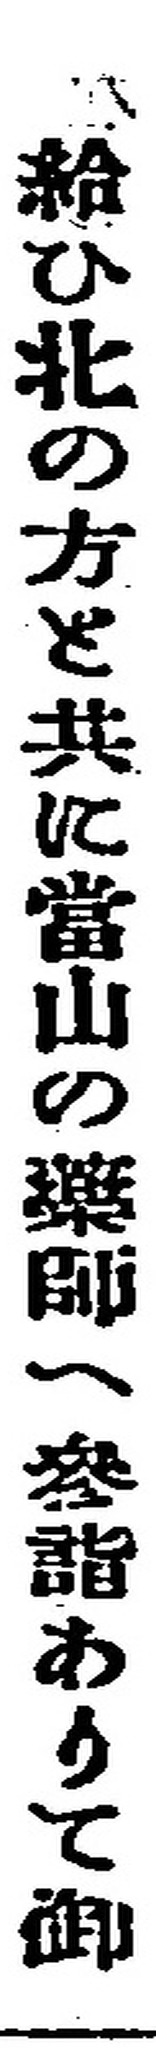給ひ北の方と共に当山の薬師へ参詣ありて御
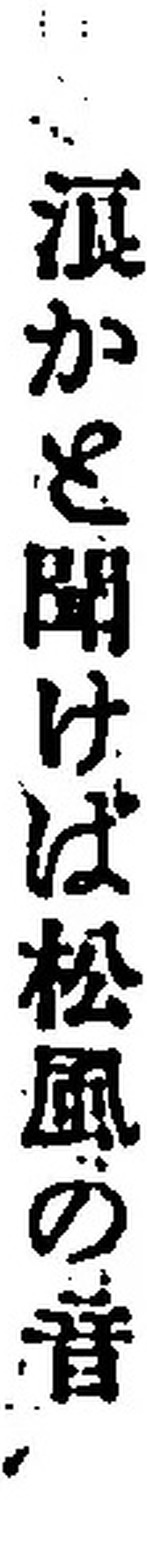浪かと聞けば松風の音
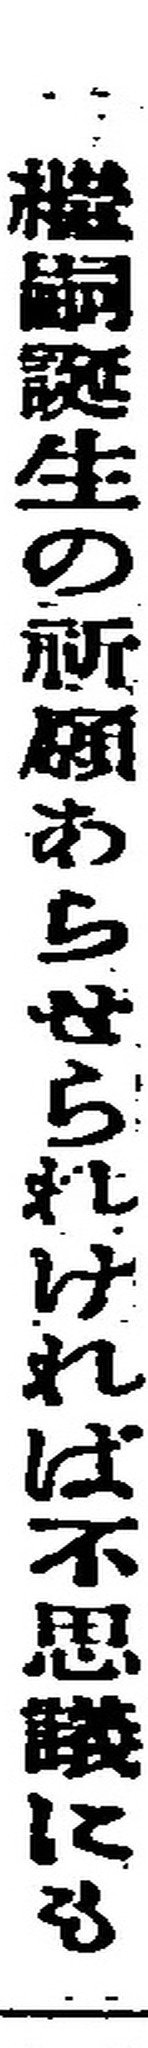継嗣誕生の祈願あらせられければ不思議にも
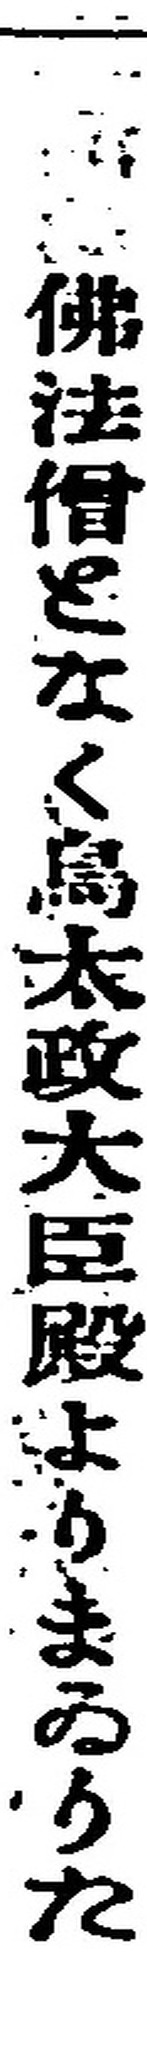仏法僧となく鳥太政大臣殿よりまゐりた
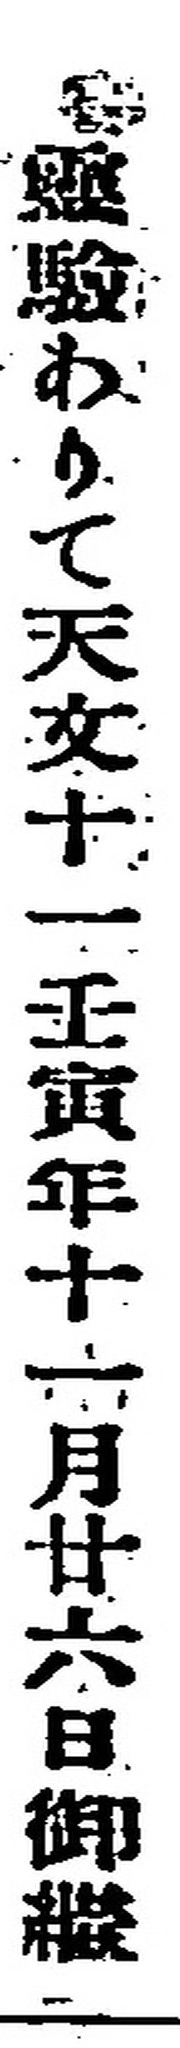霊験ありて天文十一壬寅年十一月廿六日御継
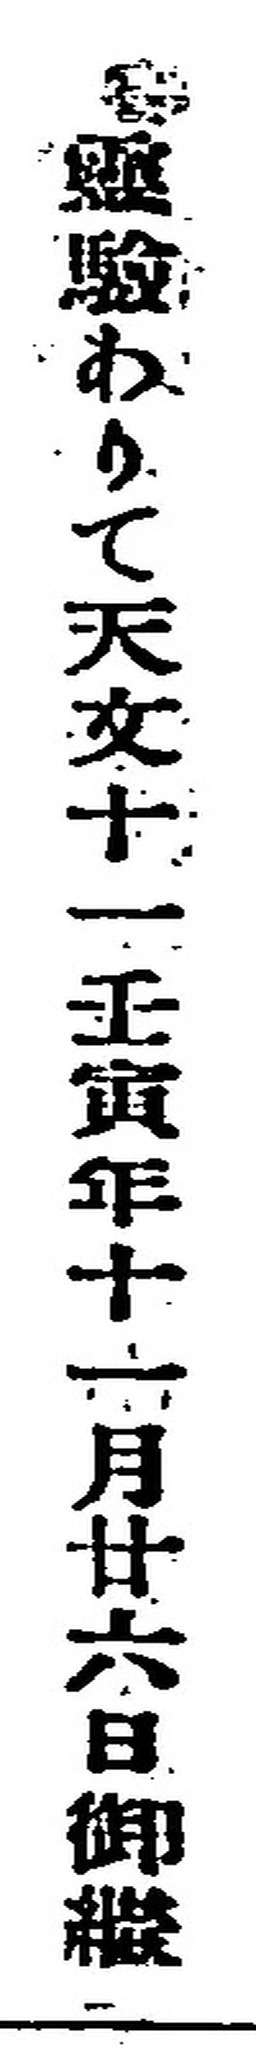霊験ありて天文十一壬寅年十一月廿六日御継
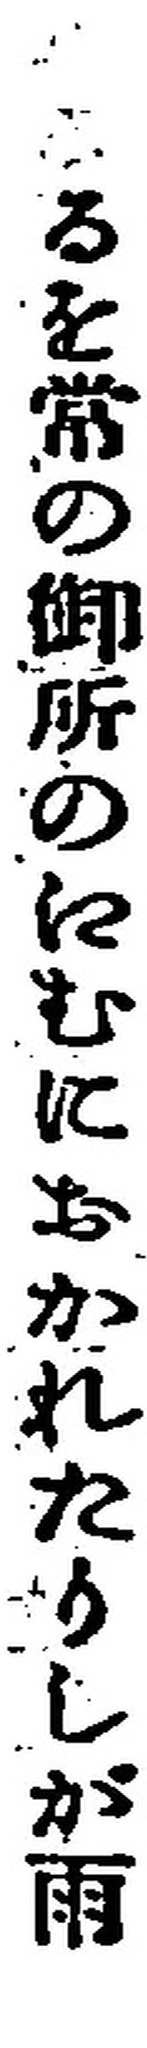るを常の御所のえむにおかれたりしが雨
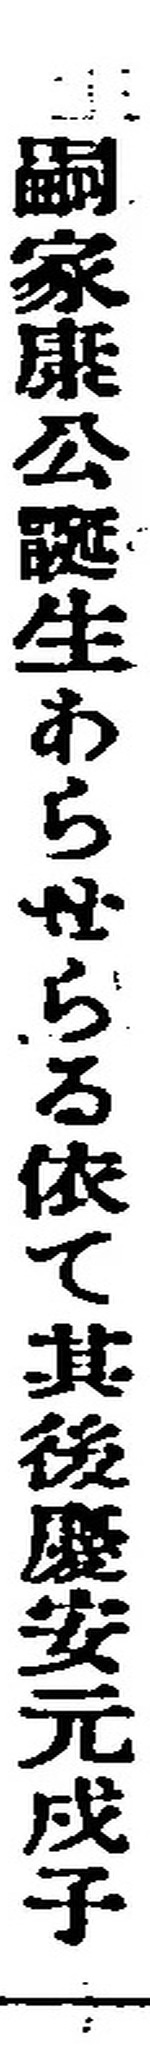嗣家康公誕生あらせらる依て其後慶安元戍子
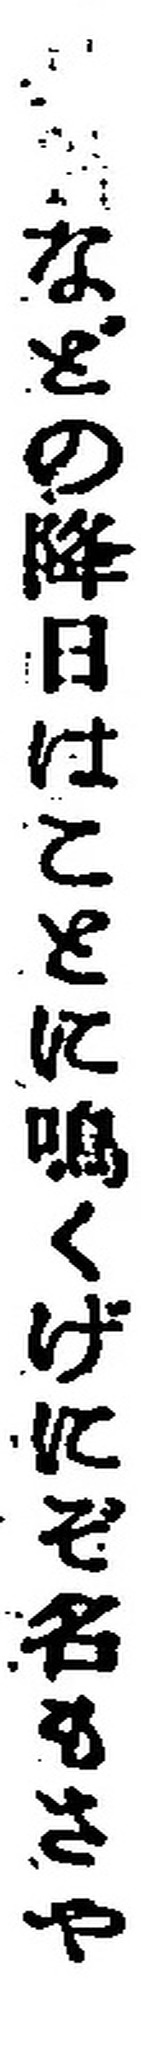などの降日はことに鳴くげにぞ名もさや
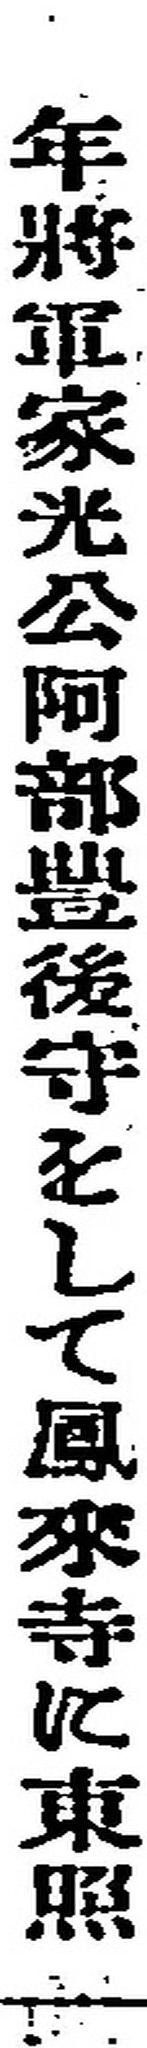年将軍家光公阿部豊後守をして鳳来寺に東照
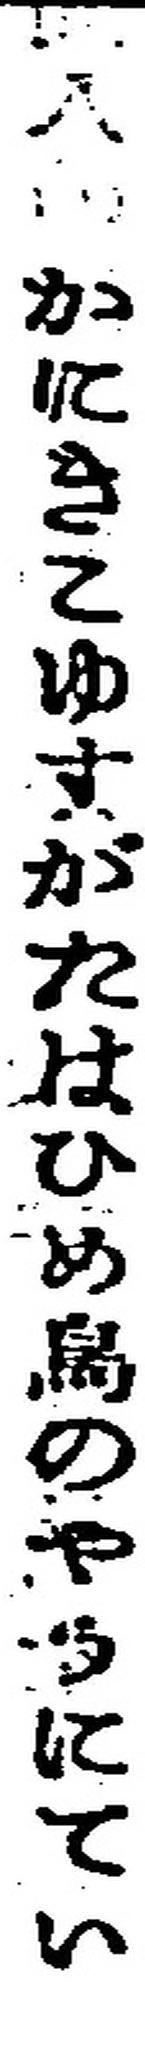かにきこゆすがたはひめ鳥のやうにてい
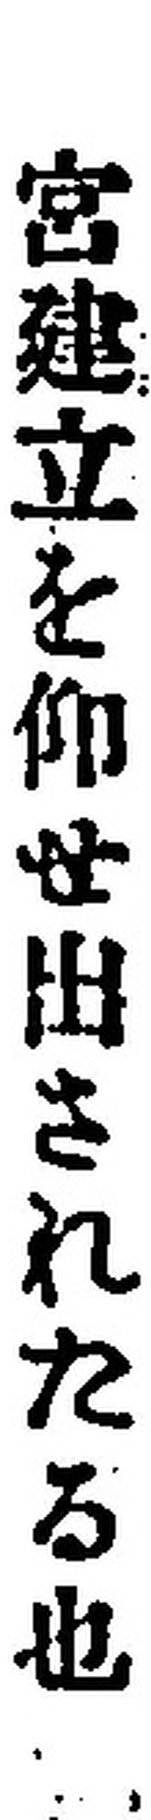宮建立を仰せ出されたる也
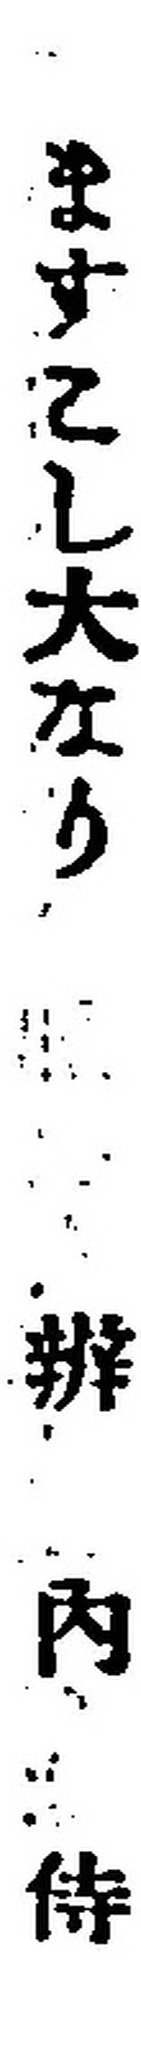ますこし大なり弁内侍
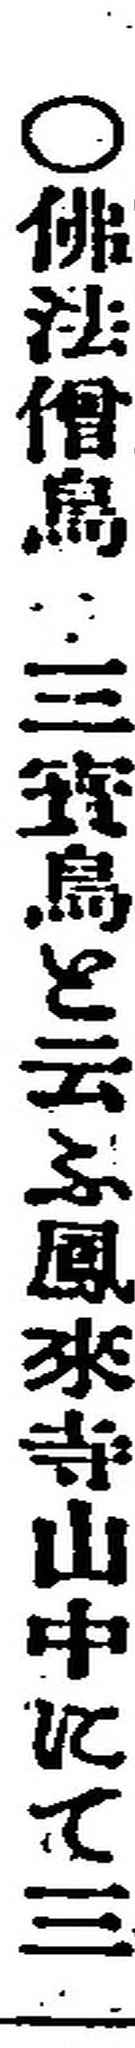○仏法僧鳥三宝鳥と云ふ鳳来寺山中にて三
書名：東参名勝案内
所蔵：国立国会図書館 National Diet Library, JAPAN
